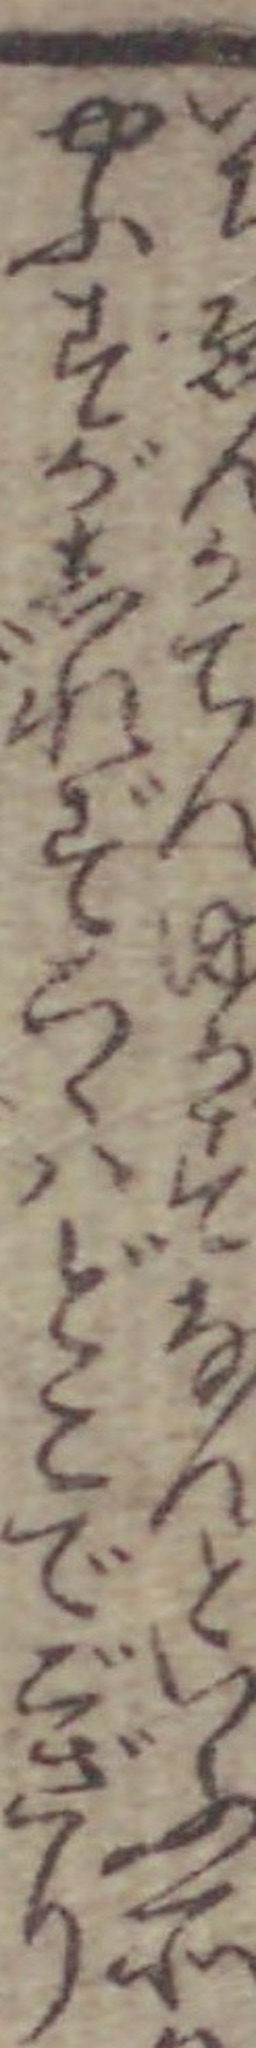やふすがしれずこゝはどこでござり
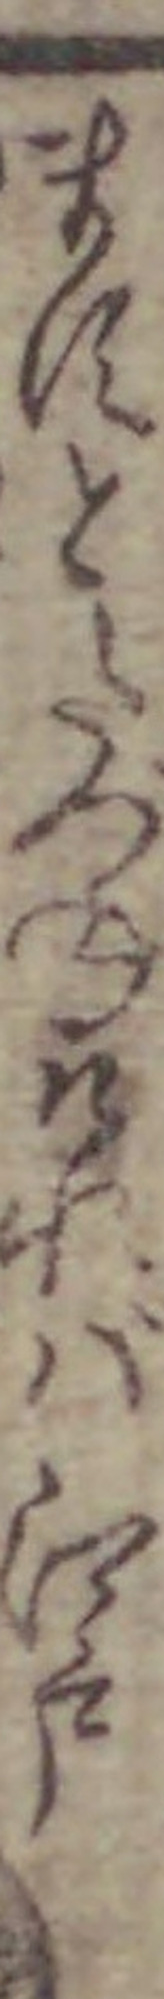ますとたづねければ江戸
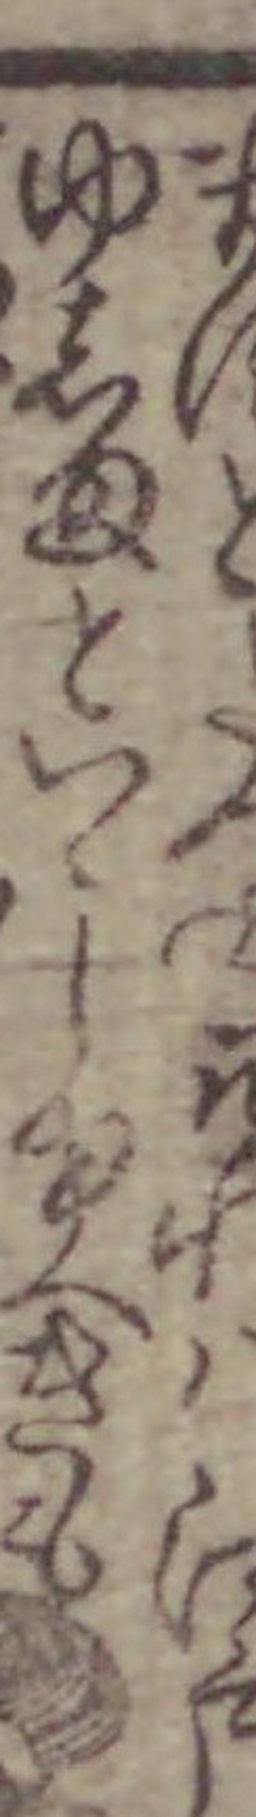ゆしまといゝしゆへきも
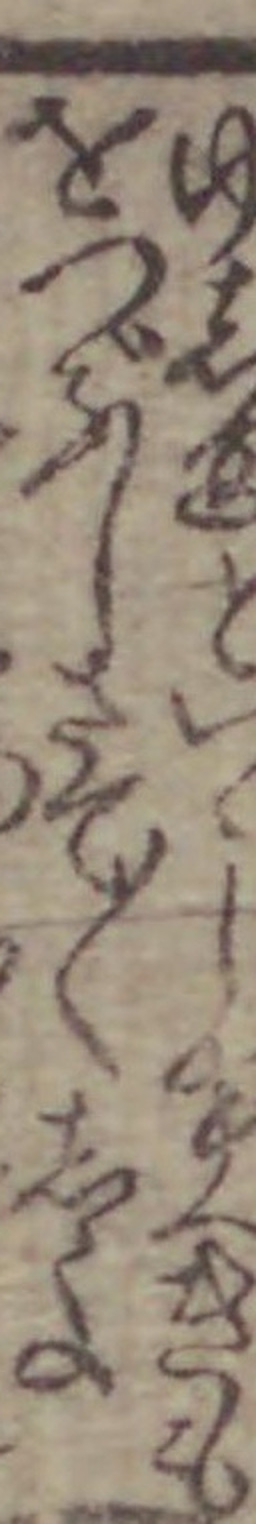をつぶしさて〳〵しよ
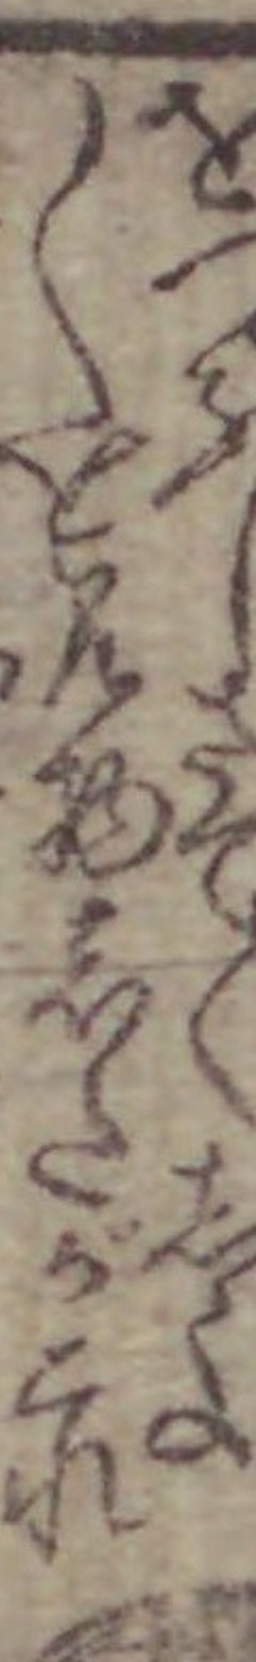〳〵を見物したがこれ
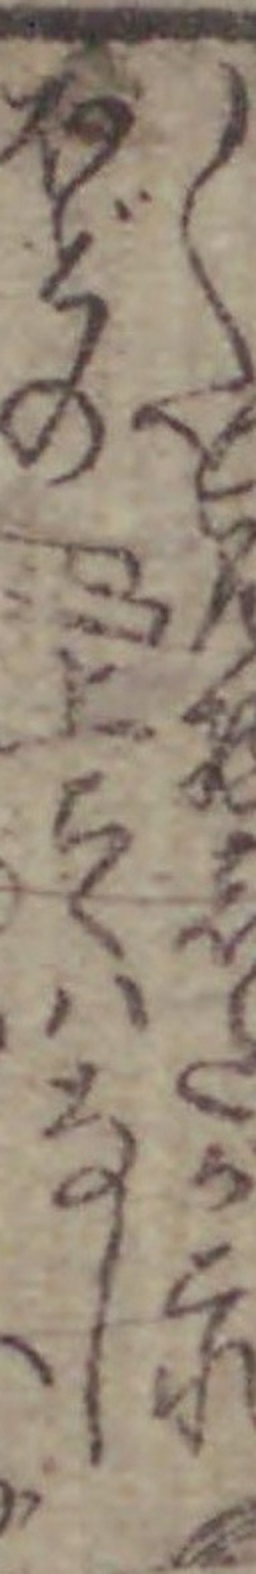ほどの上こくはなし
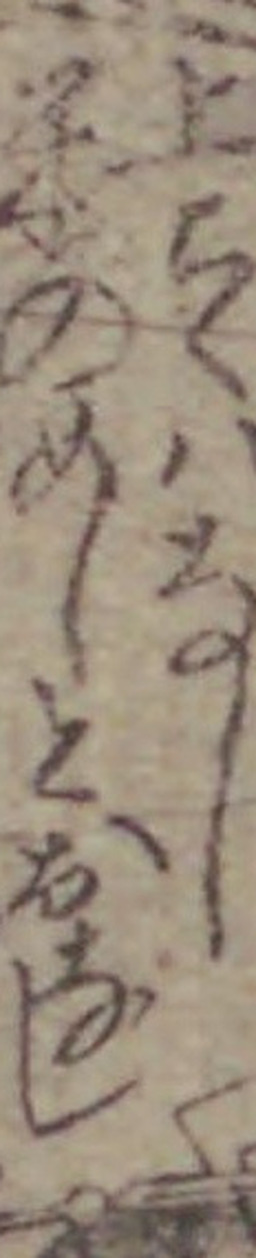米のめしとおなし
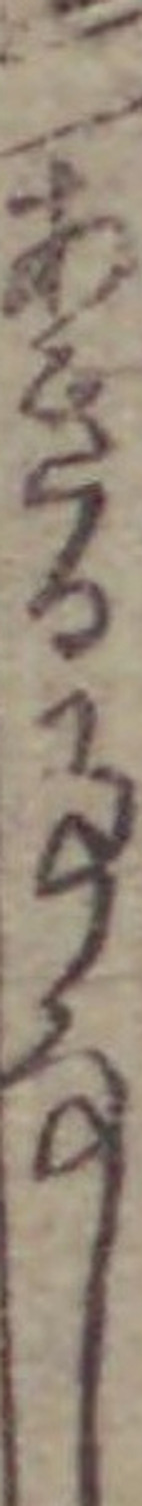あきる事なし
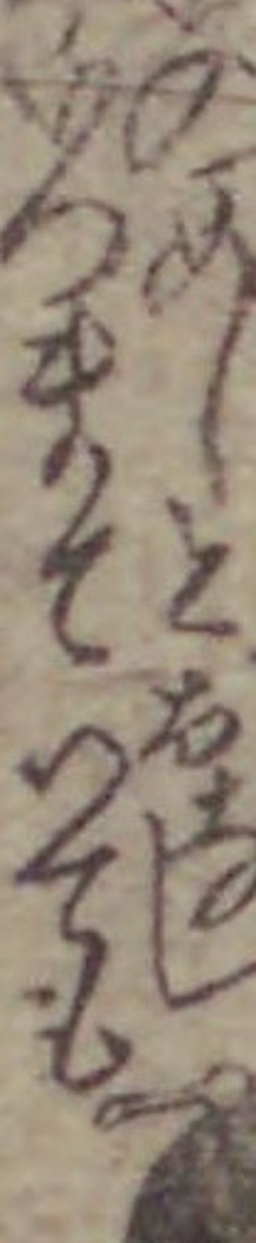事いつまていても
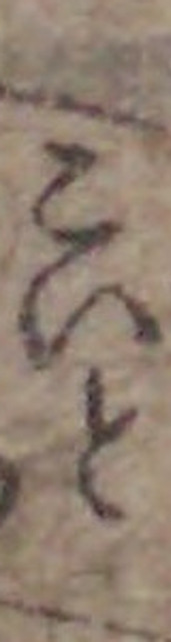こいと
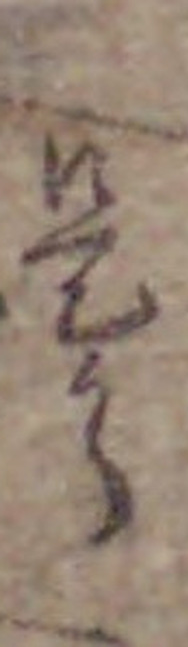是から

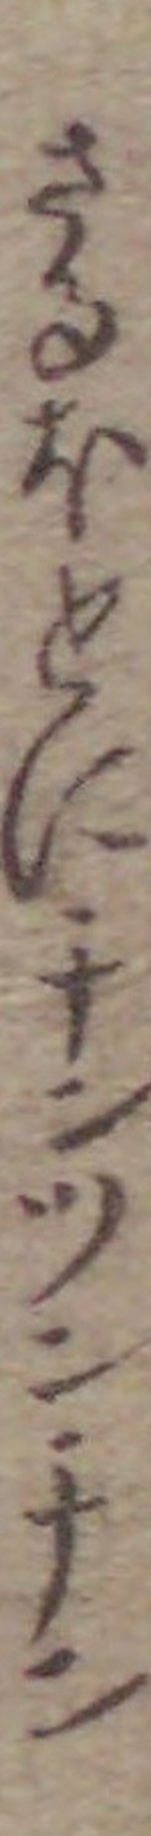さるほとにチンツンチン
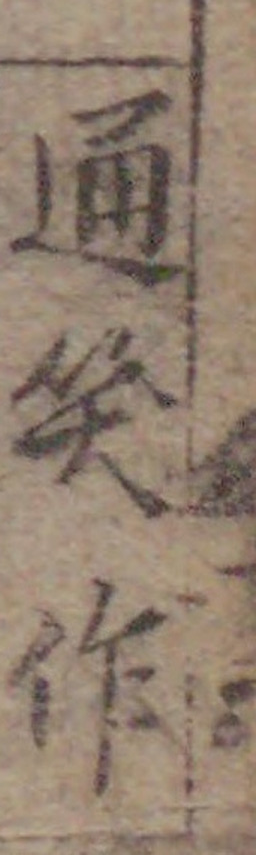通笑作
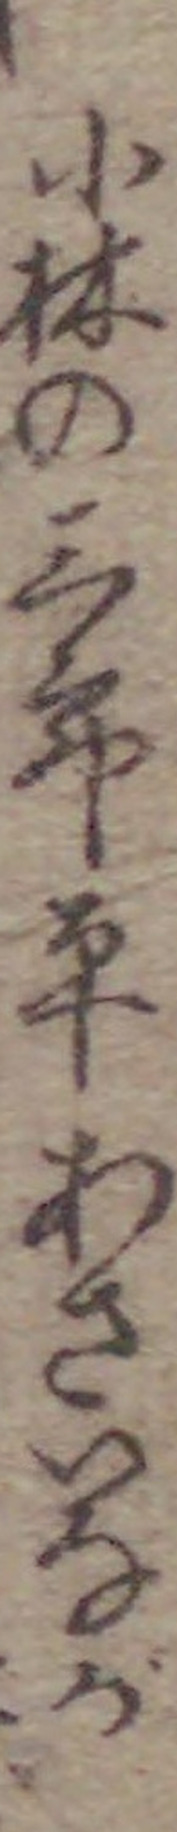小林の三郎平あさいなが
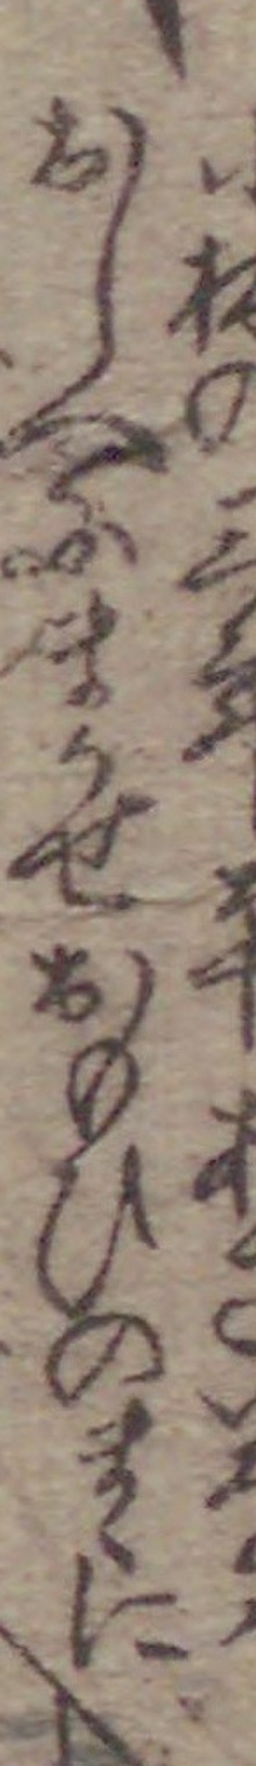おしへにまかせおもひのまゝに
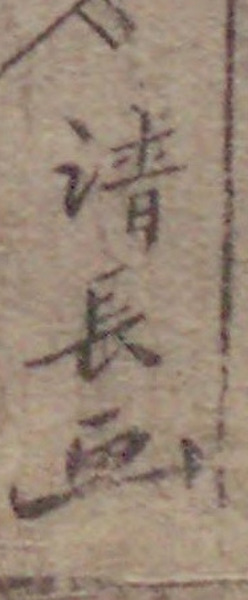清長画
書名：近頃嶋めぐり 3巻
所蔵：国立国会図書館 National Diet Library, JAPAN
